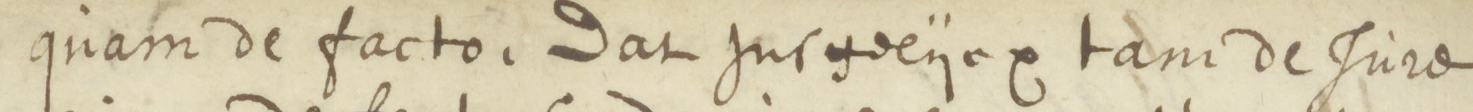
quam de facto. Dat insgelijcx tam de jure
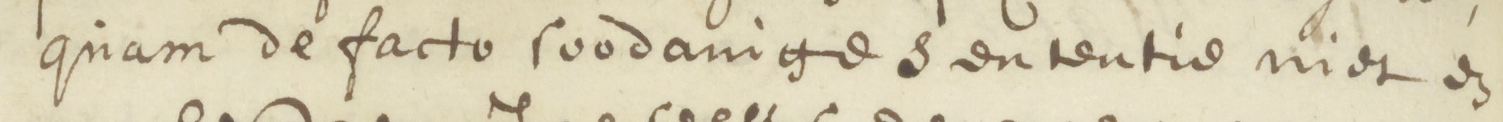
quam de facto soodanige sententie niet en
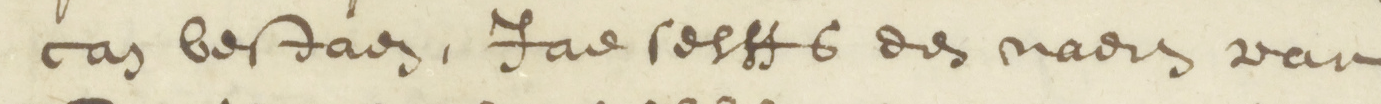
can bestaen, Jae selffs den naem van
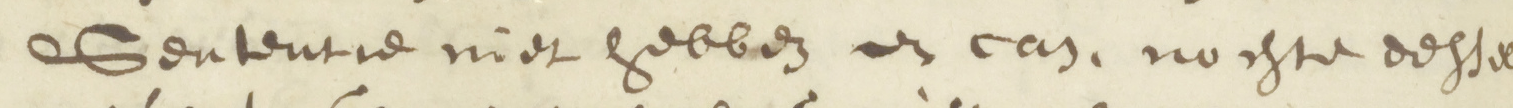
Sententie niet hebben en can, nochte desself
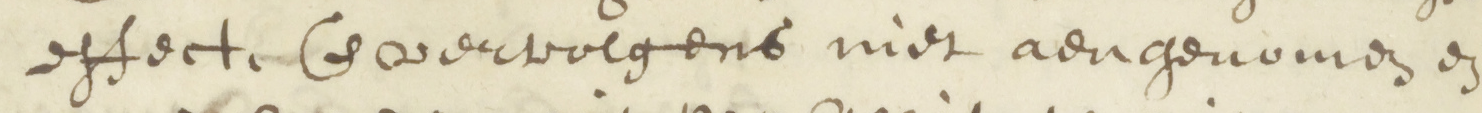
effect. & vervolgens niet aengenomen en
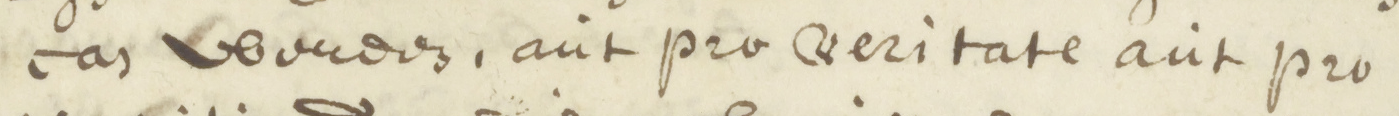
can werden, aut pro veritate aut pro —
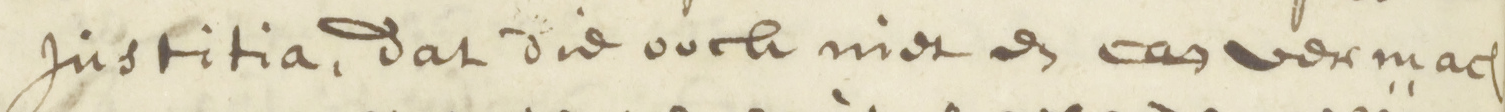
Justitia, dat die oock niet en can vermach
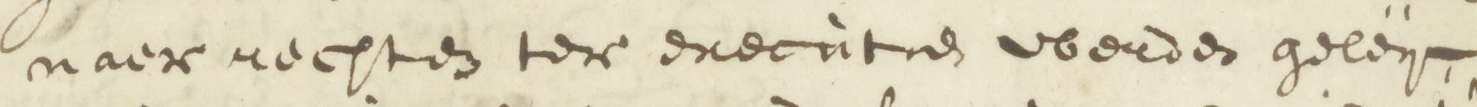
naer rechten ter executie werden geleijt
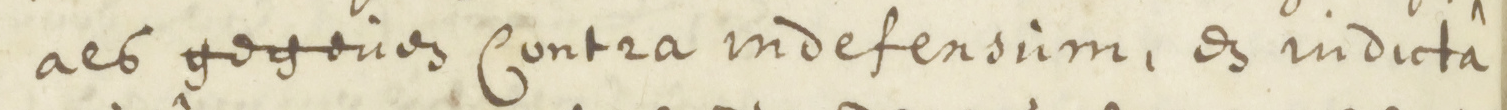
als gegeven contra indefensum, en indictâ
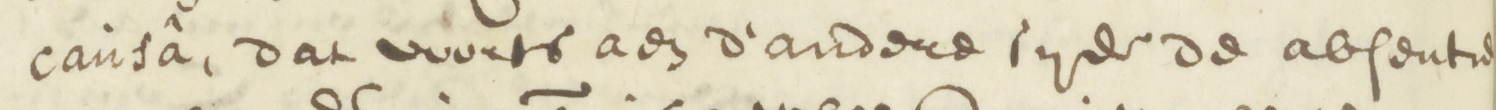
causâ, dat voorts aen d'andere sijde de absentie
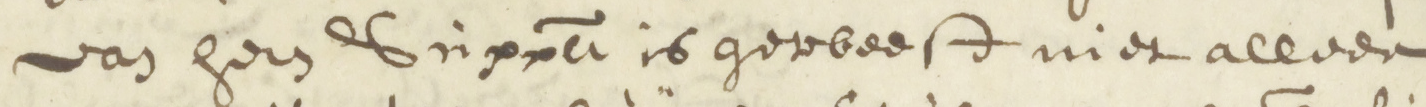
van hen suppl. is geweest niet alleen
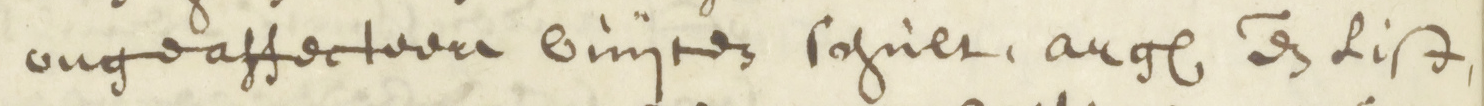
ongeaffecteert buijten schult, argh en list,
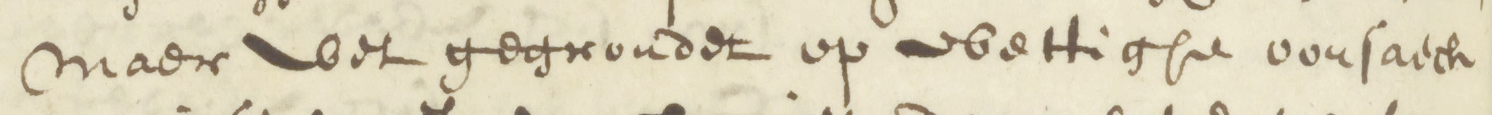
maer wel gegrondet op wettighe oorsaeck
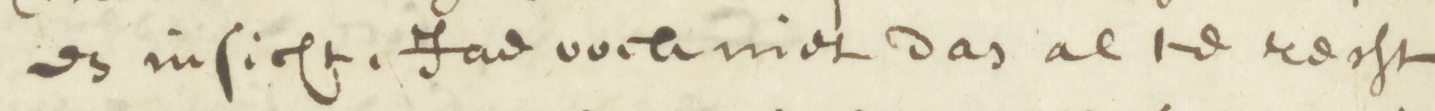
en insicht. Jae oock niet dan al te recht
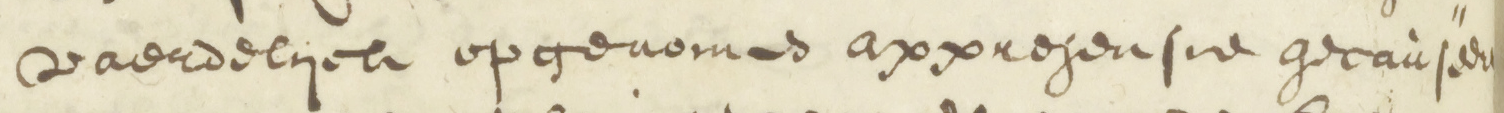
vaerdelijck opgenomen apprehensie gecauseert
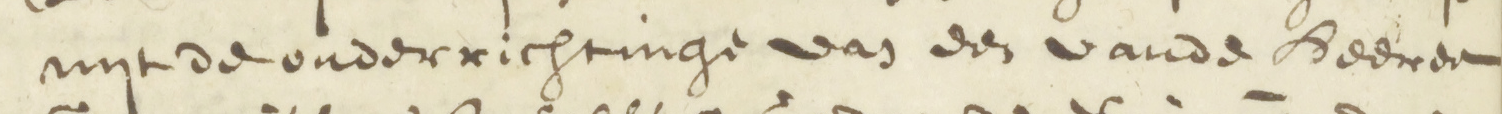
uyt de onderrichtinge van een van de heeren
